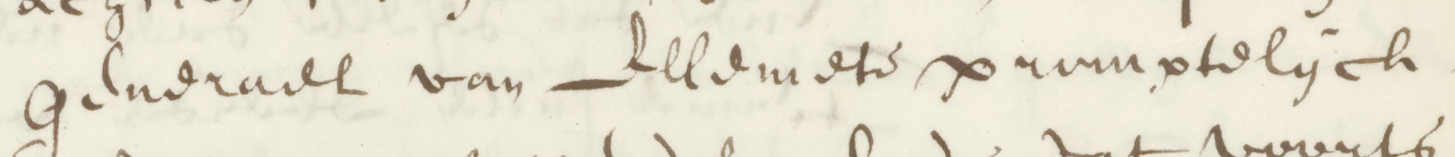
generael van Ellemete promptelijck
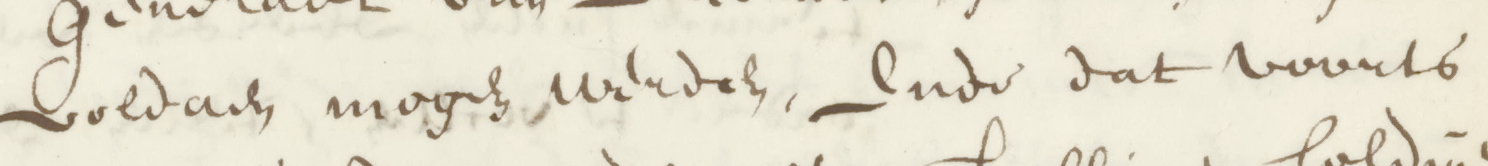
voldaen mogen werden, ende dat voorts
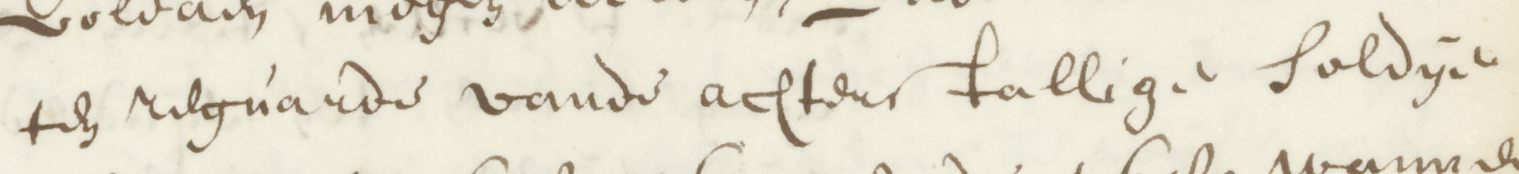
ten reguarde vande achterstallige soldije
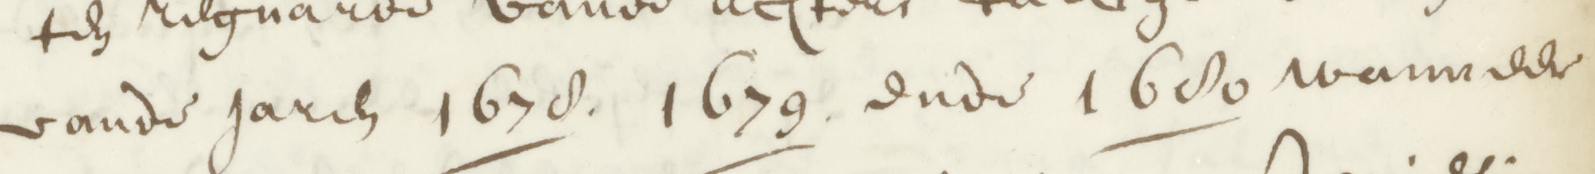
vande jaren 1678, 1679 ende 1680 wanneer
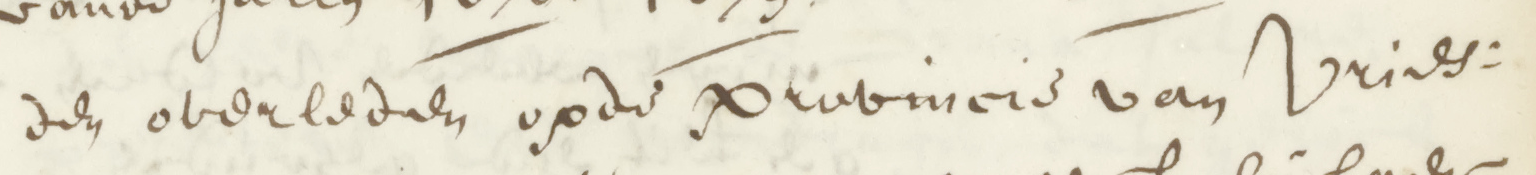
den overleden opde provincie van Vries„
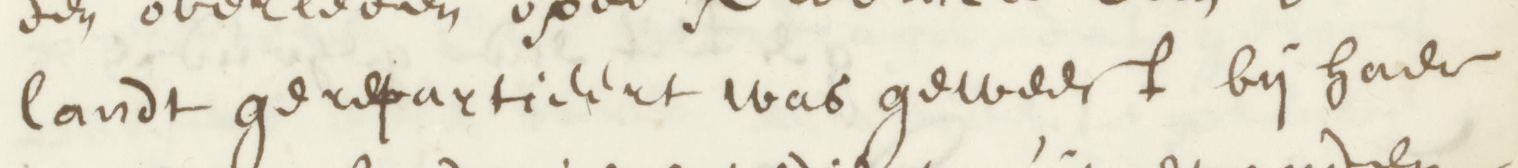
landt gerepartieert was geweest bij haer
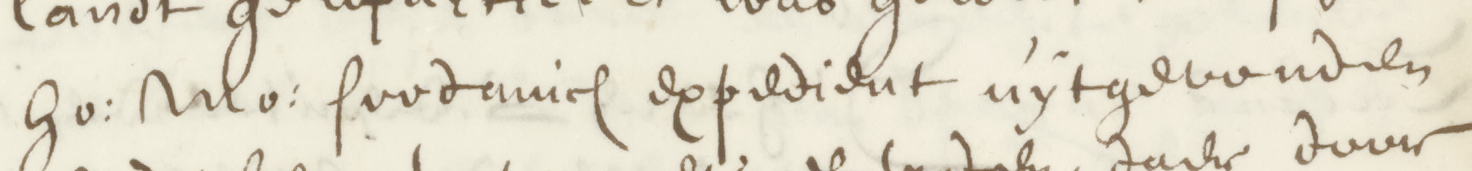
Ho:Mo: soodanich expedient uytgevonden
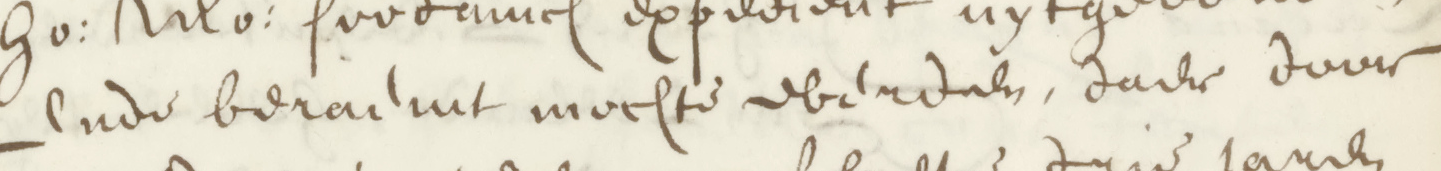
ende beraemt mochte werden, daer door
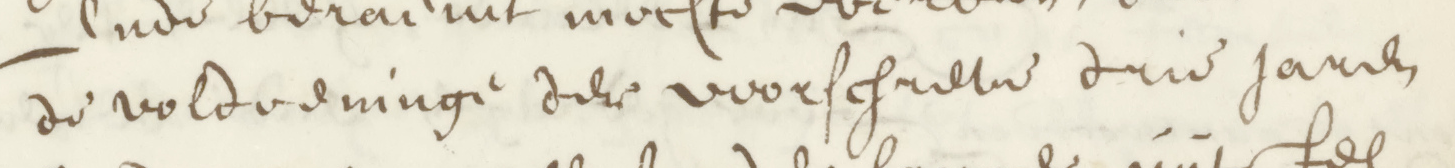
de voldoeninge der voorschreve drie jaren
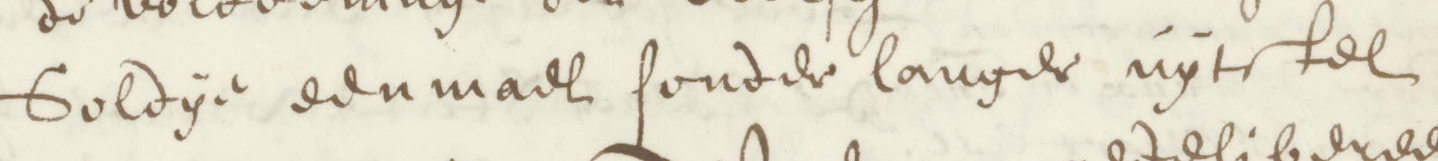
soldije eenmael sonder langer uijtstel
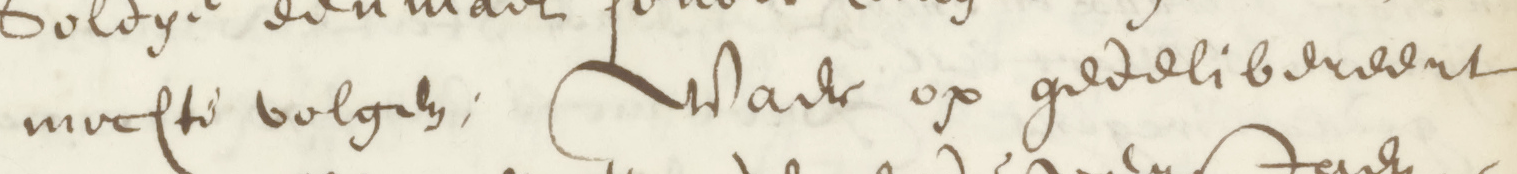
mochte volgen: Waer op gedelibereert
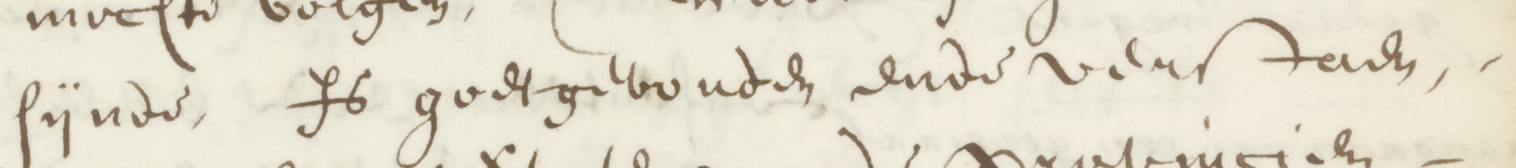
sijnde, Is goetgevonden ende verstaen,
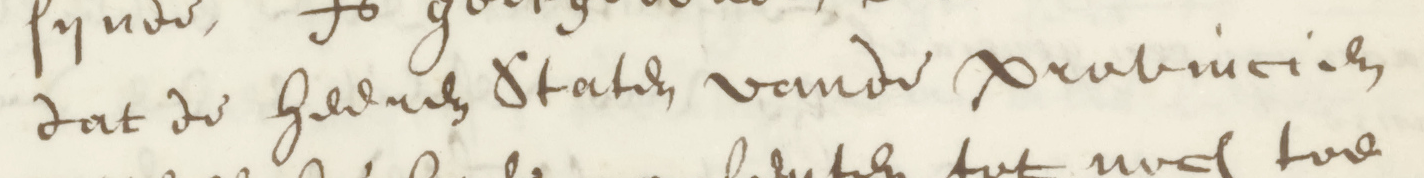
dat de heeren Staten vande procincien
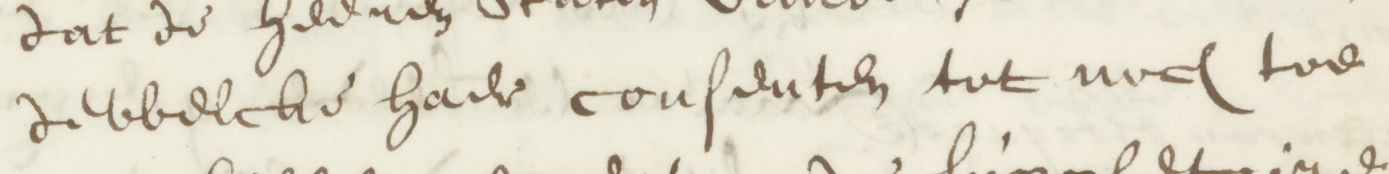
dewelcke haer consenten tot noch toe
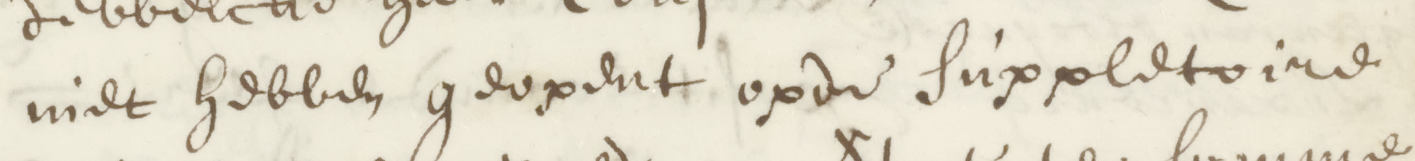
niet hebben geopent opde suppletoire
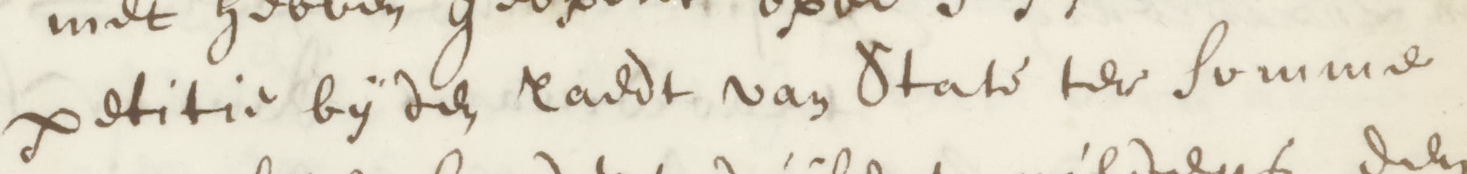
petitie bij den raedt van State ter somme
